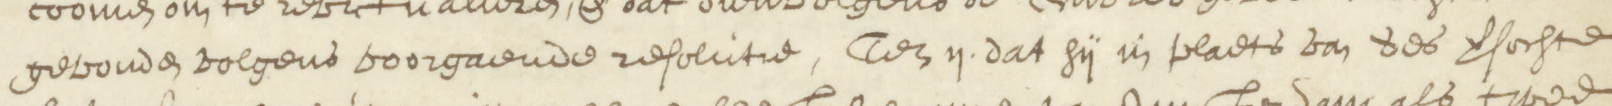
gevonden volgens voorgaende resolutie, Tenzy dat hij in plaets van ses vsochte
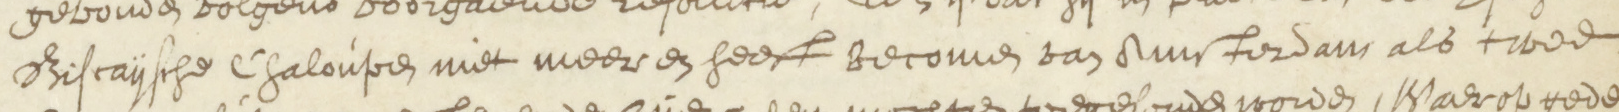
Biscaijsche Chaloupen niet meer en heeft becomen van Amsterdam als twee
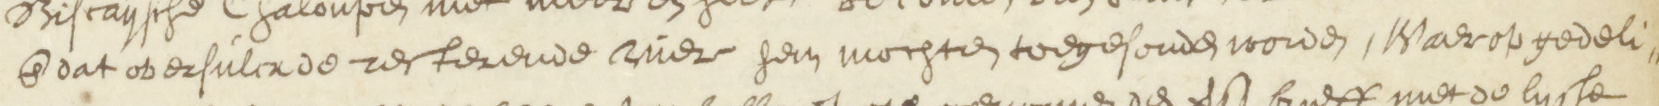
& dat over sulcx de resterende vier hem mochten toegesonden worden, Waerop gedeli„
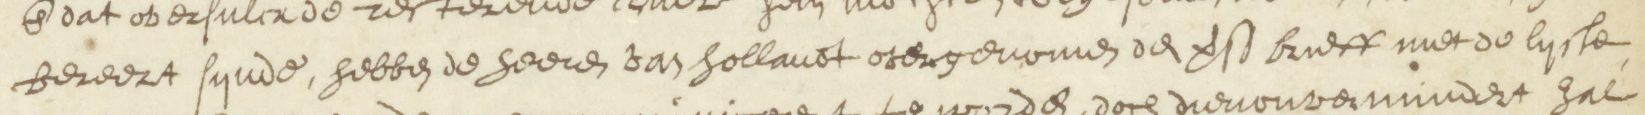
bereert synde, hebben de heeren van hollandt overgenomen den vs brieff met de lyste
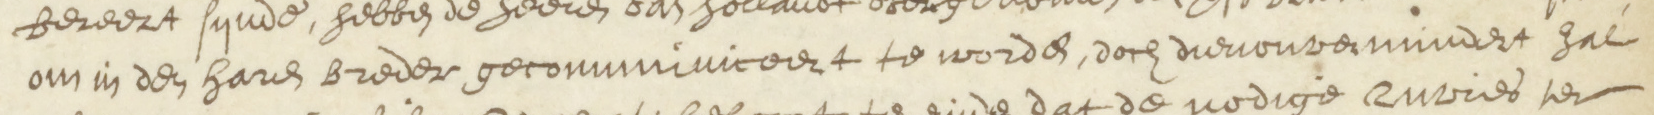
om in den haren breder gecommuniceert te worden, doch dienonvermindert zal
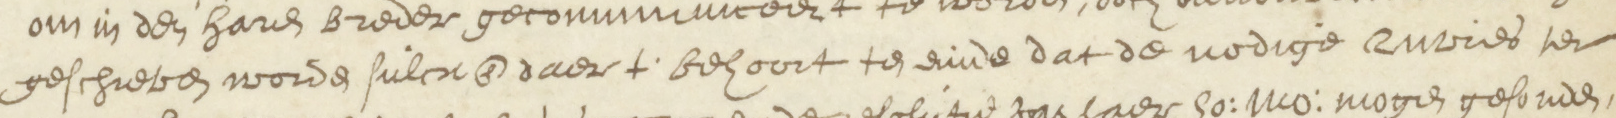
geschreven worden sulcx & daer t‛behoort ten einde dat de nodige vivres ter
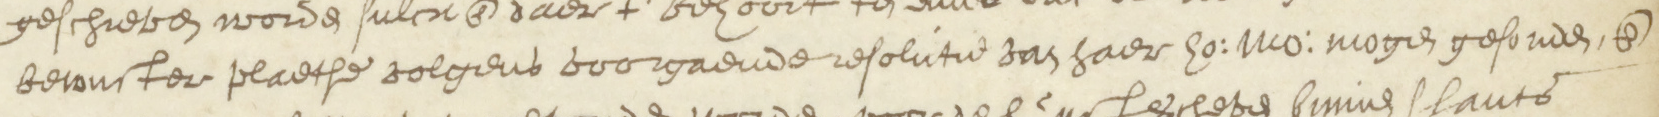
bewuster plaetse volgens voorgaende resolutie van haer ho:Mo: mogen gesonden, &
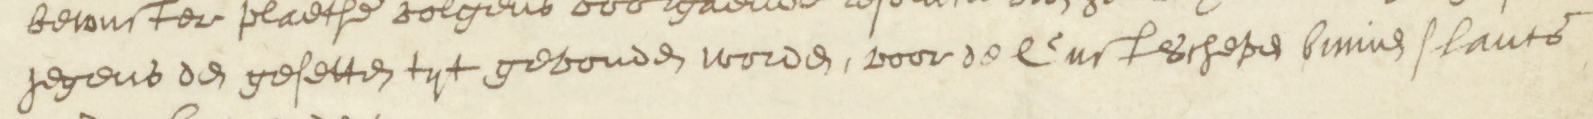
jegens den gesetten tyt gevonden worden, voor de Custschepen binnen sLants
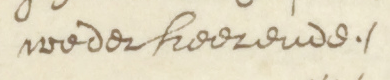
wederkeerende.
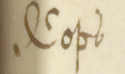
Cops
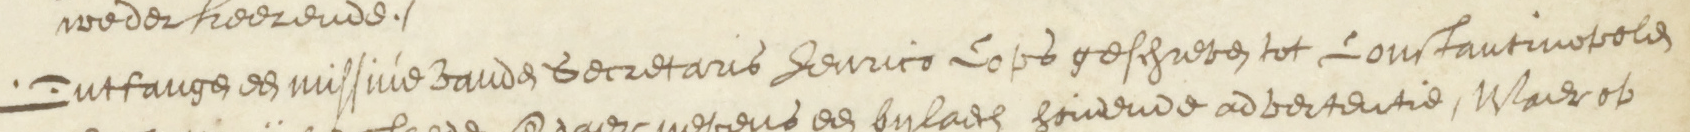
Ontfangen een missiue vanden Secretaris Henrico Cops geschreven tot Constantinopolen
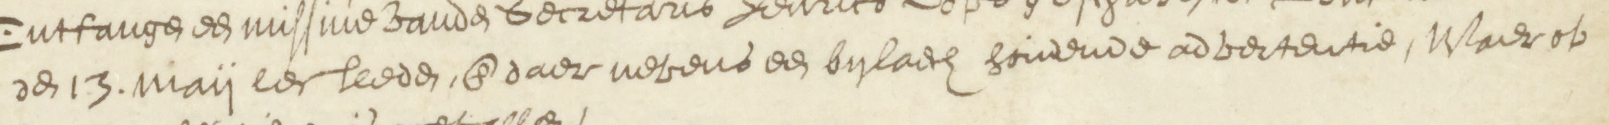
den 13. Maij lestleden, & daer nevens een bylaech houdende advertentie, Waerop
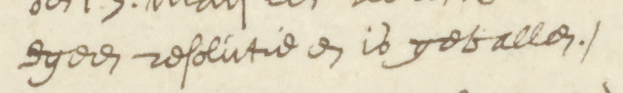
egeen resolutie en is gevallen.
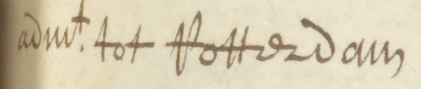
admt. tot Rotterdam
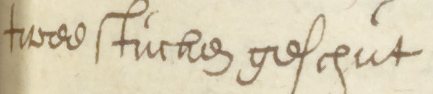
twee stucken geschut
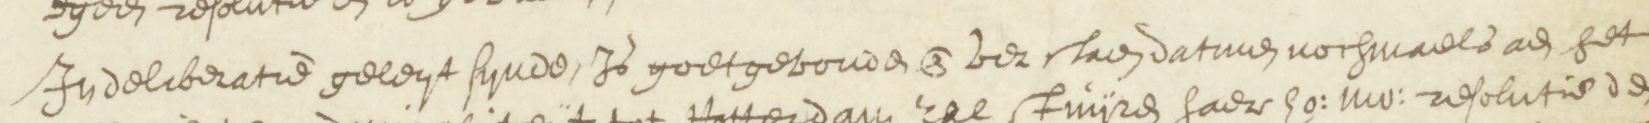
In deliberatie geleyt synde, Is goetgevonden & verstaen dat men nochmaels aen het
